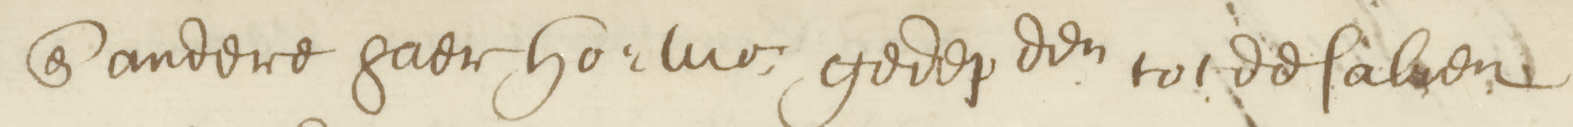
& andere haer ho:mo: gedepden tot de saken
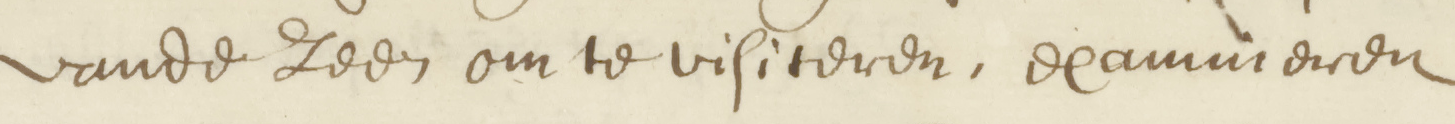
vande Zeen, om te visiteren, examineren
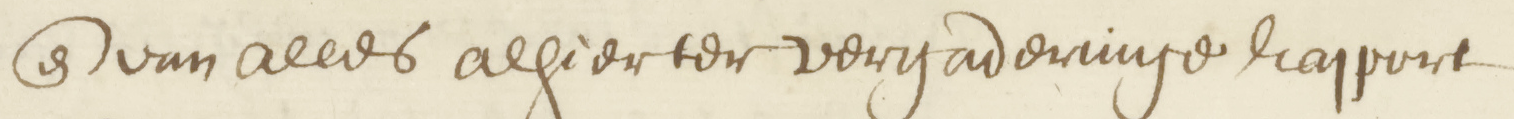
en van alles alhier ter vergaderinge rapport
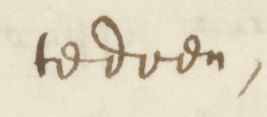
te doen.
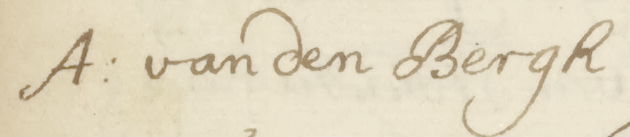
A: van den Bergh
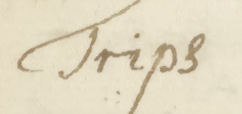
Trips
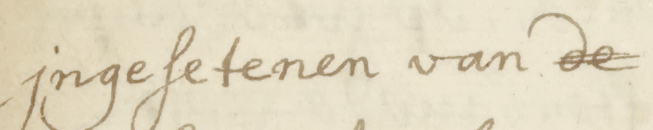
ingesetenen van de
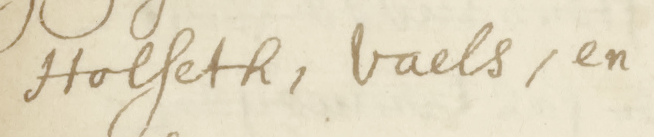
Holseth, Vaels, en
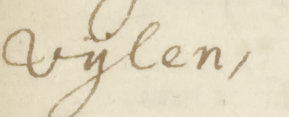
Vijlen.
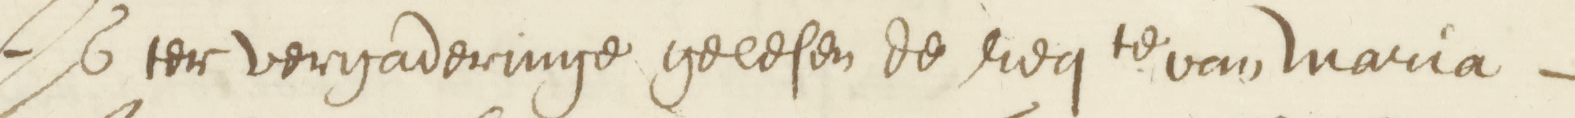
Is ter vergaderinge gelesen de reqte van Maria
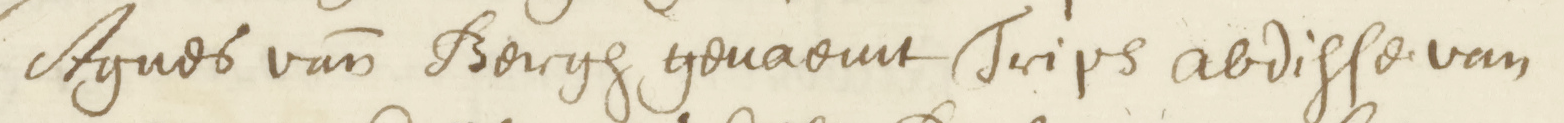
Agnes van Bergh genaemt Trips abdisse van
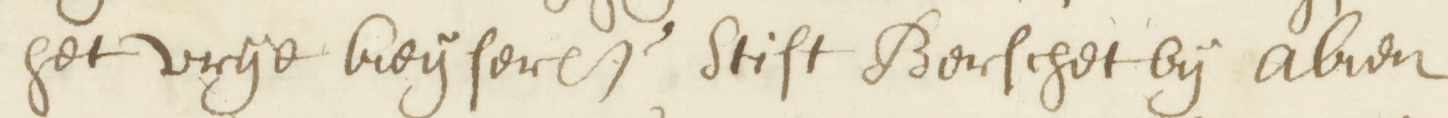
het vrije keijserl Stift Berschet bij Aken
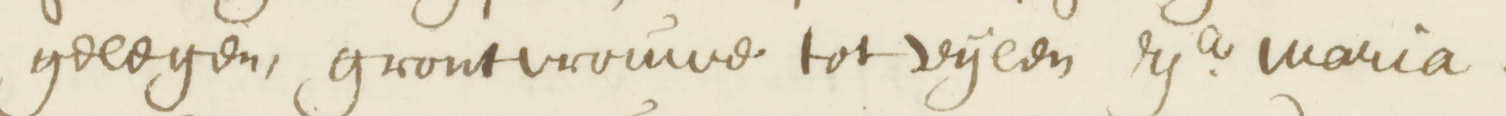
gelegen, grontvrouwe tot vijlen rga. Maria
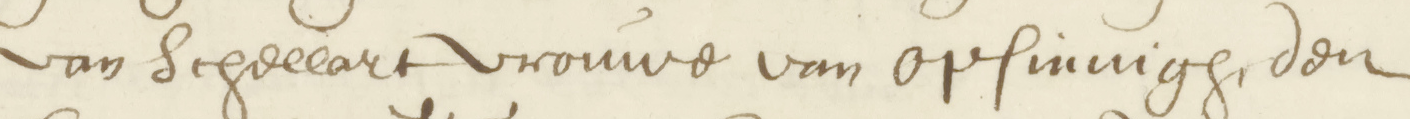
van Schellart vrouwe van Opsinnigh, den
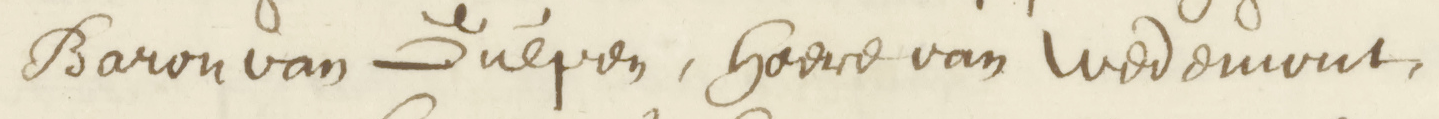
Baron van Gulpen, heere van Wedemont,
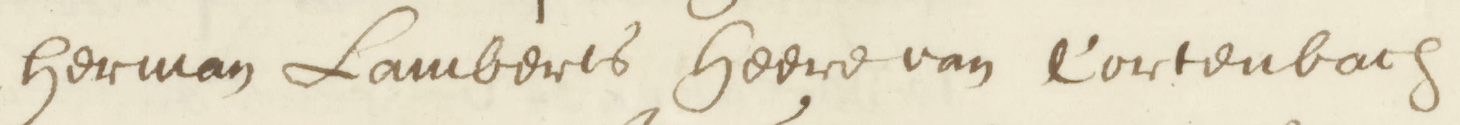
herman Lamberts heere van Cortenbach
